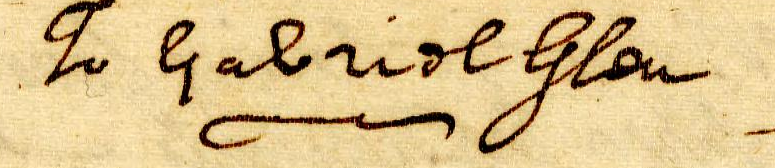To Gabriel Glen
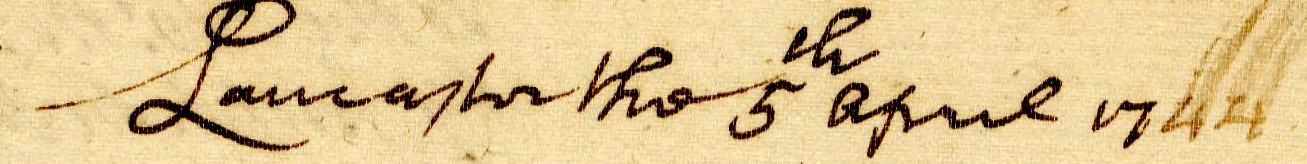Lancaster the 5^th April 1744
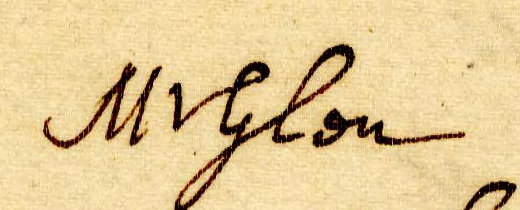M^r Glen
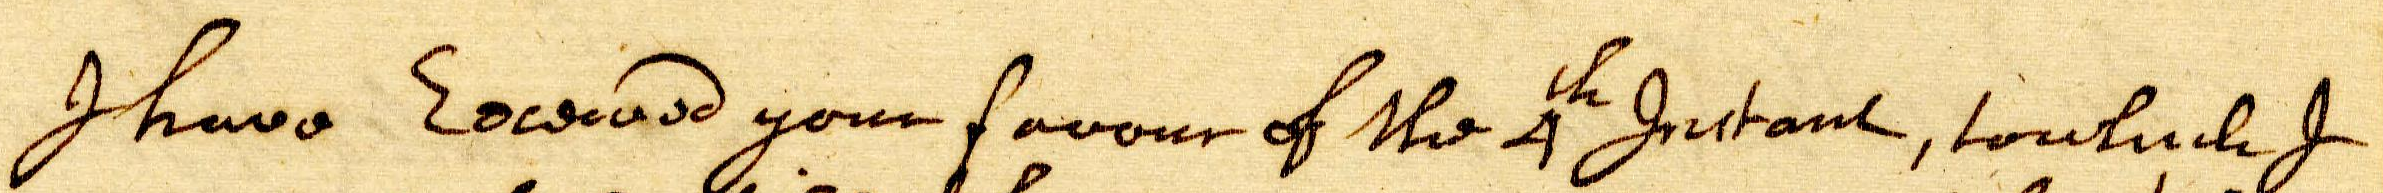I have received your favour of the 4^th Instant, to which I
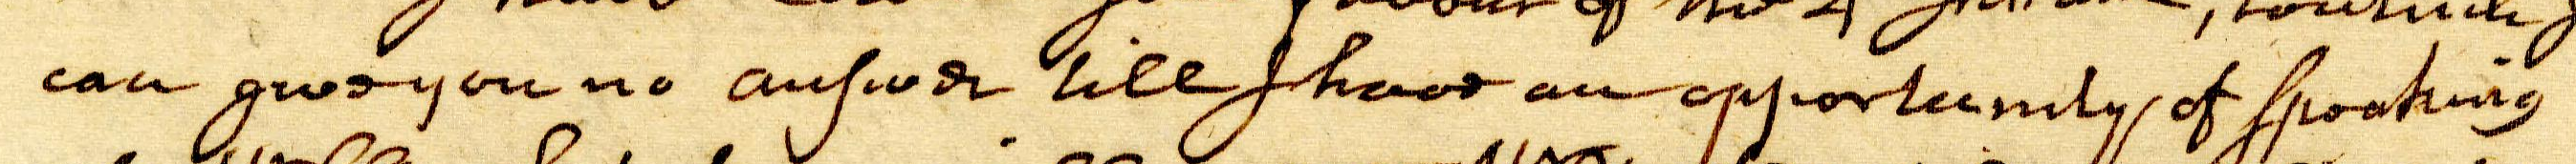can give you no answer till I have an opportunity of speaking
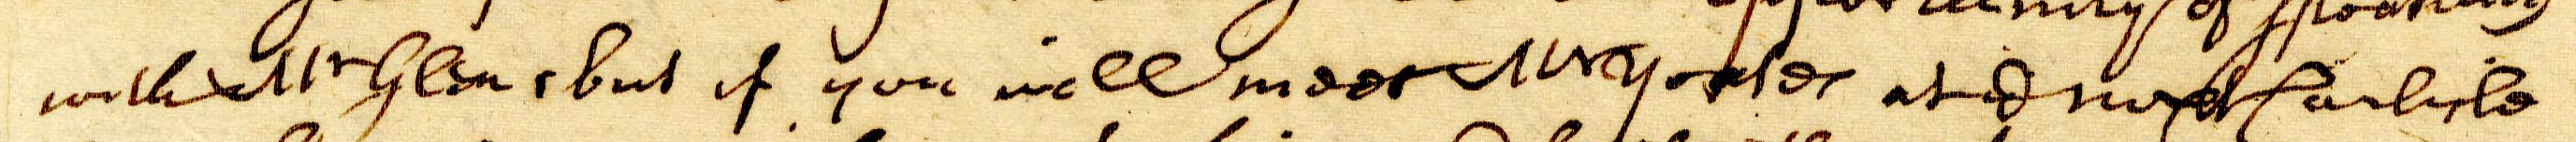with M^r Glen but if you will meet Mr Yeates at the next Carlile
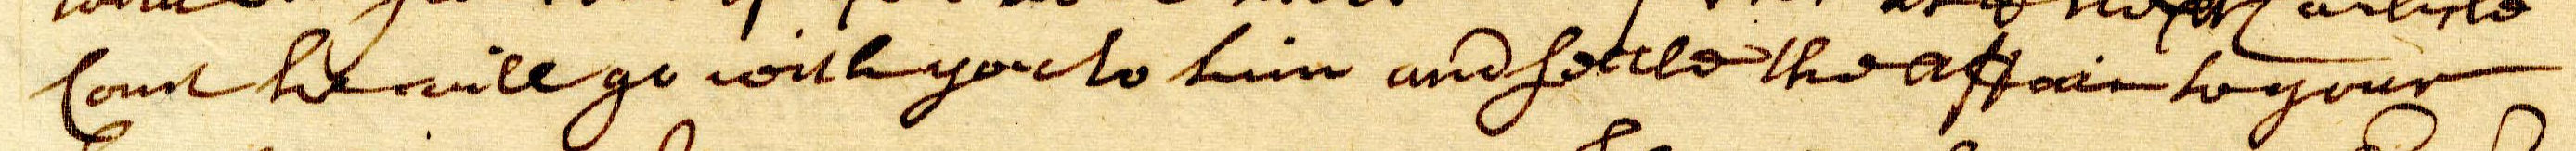Court he will go with you to him and settle the affair to your
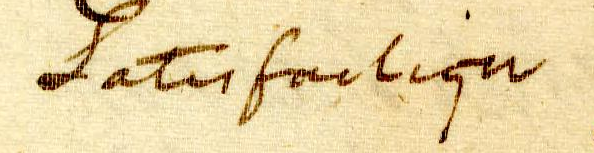Satisfaction
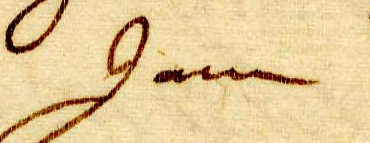I am
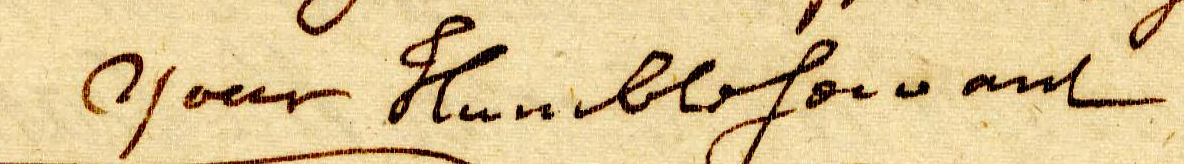Your Humble Servant
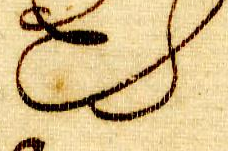ES
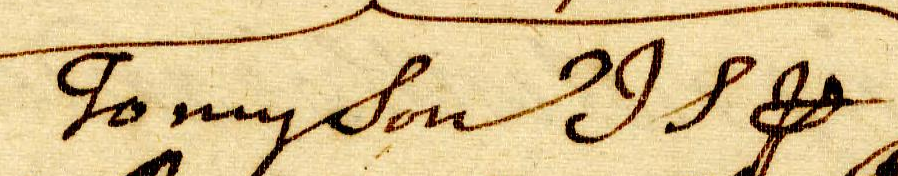To my Son JS per
